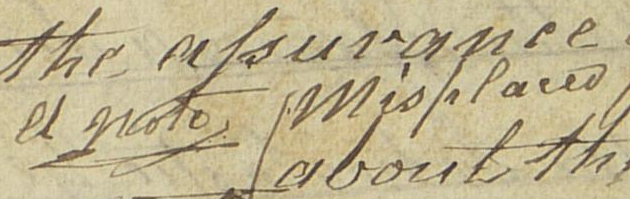a note / Misplaced
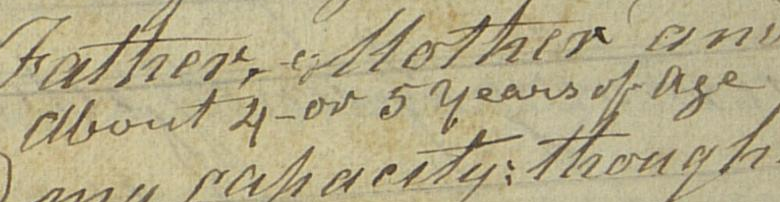About 4- or 5 years of age
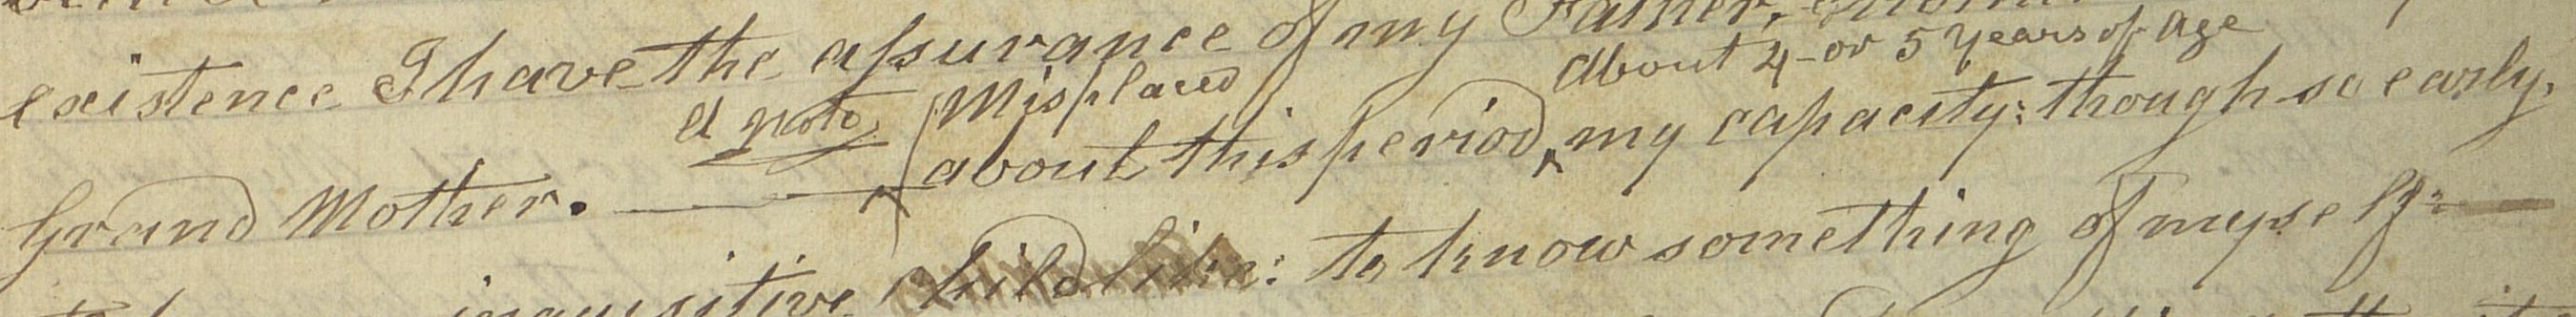Grand Mother. ^ (about this period ^ my capacity: though so early,
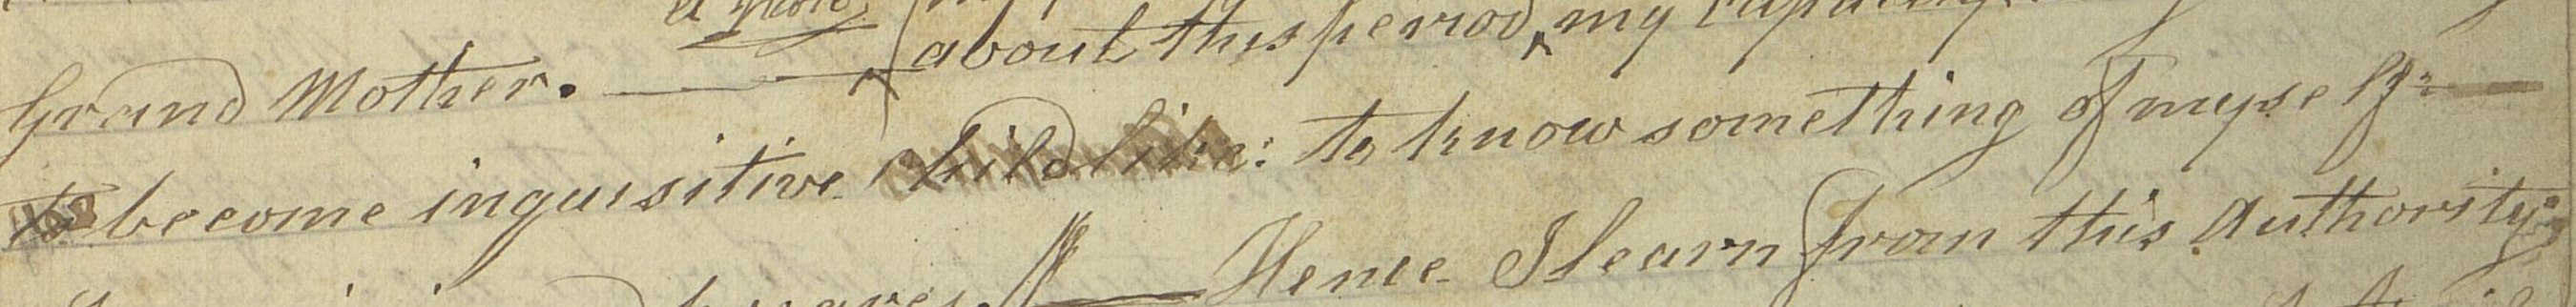to become inquisitive childlike: to know something of myself:
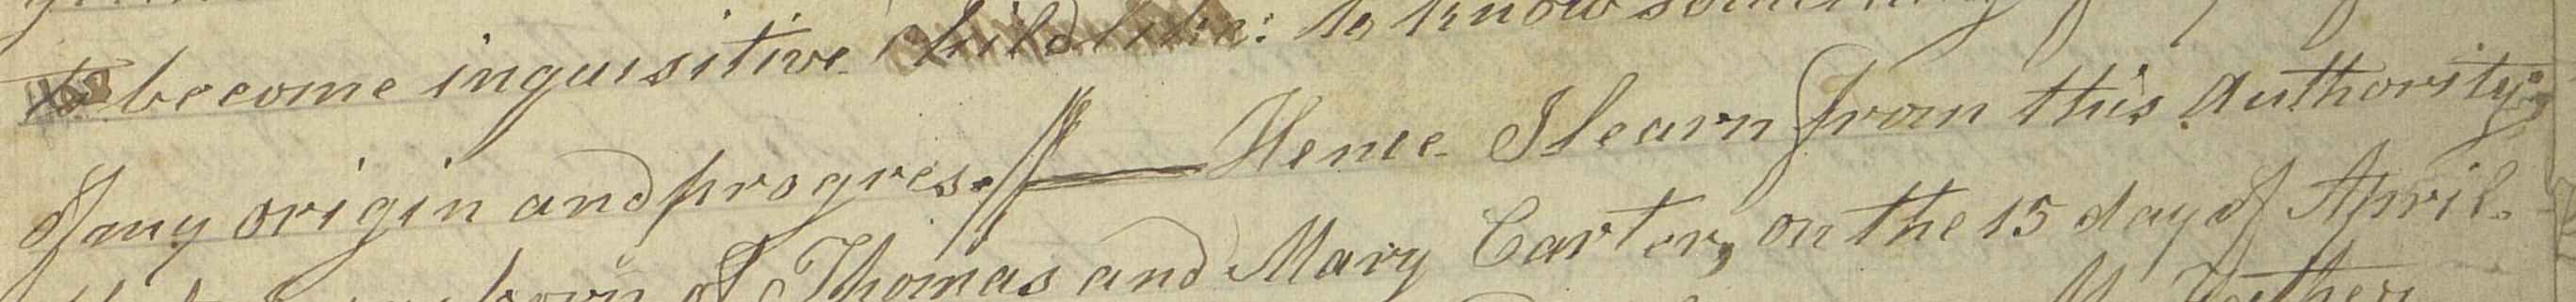of any origin and progress.) Hence I learn from this authority;
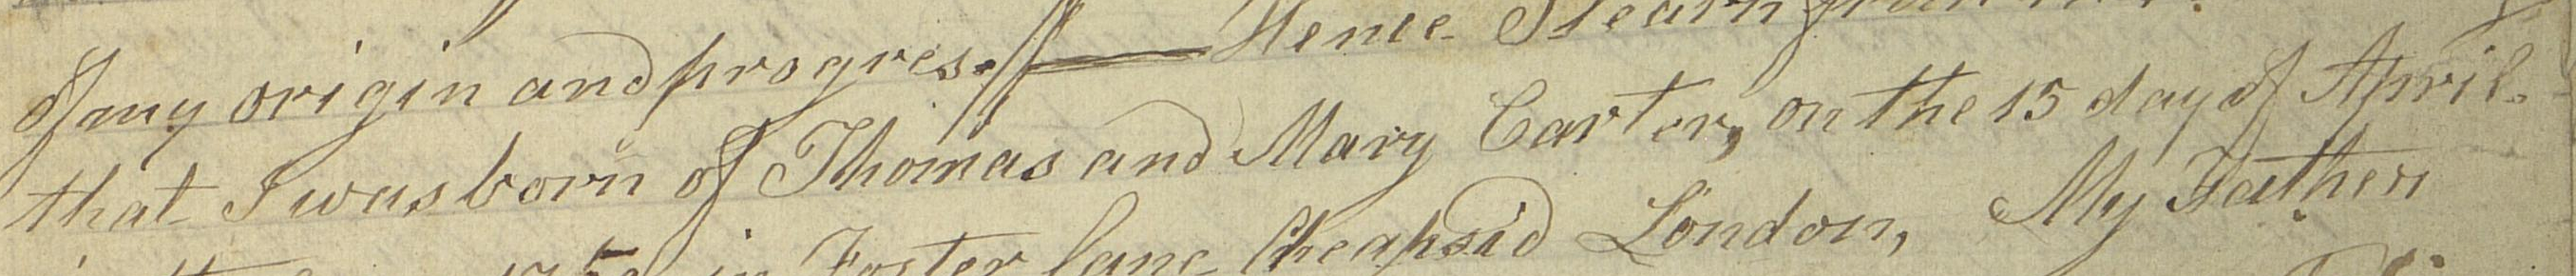that I was born of Thomas and Mary Carter, on the 15 day of April
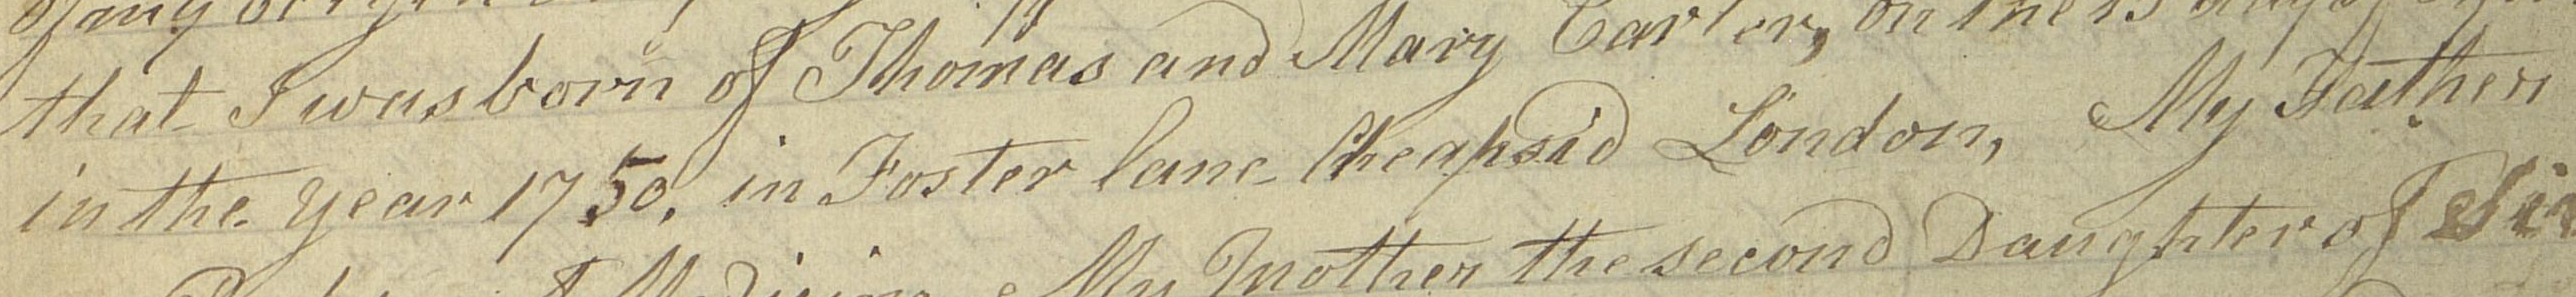in the year 1750, in Foster lane Cheapsid London, My Father
